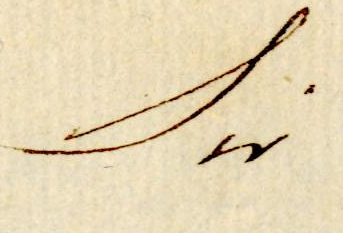Sir
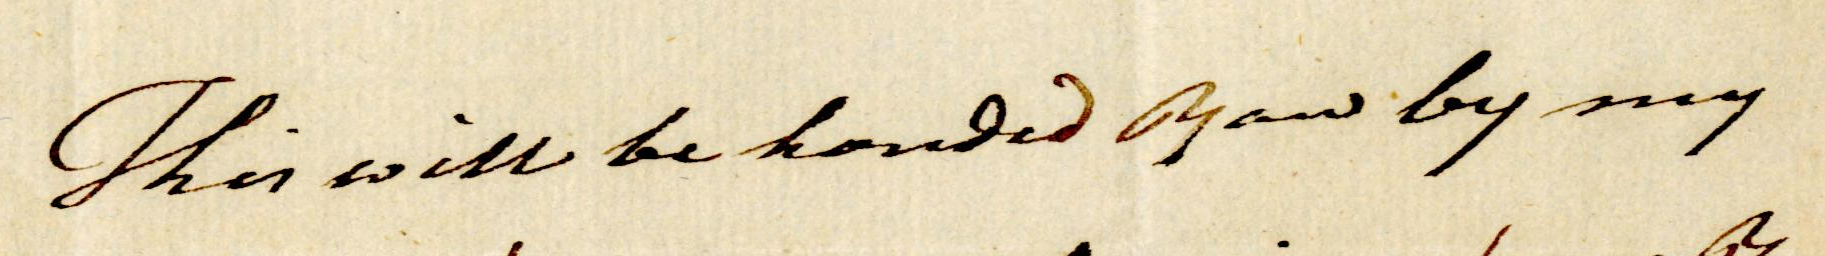This will be handed you by my
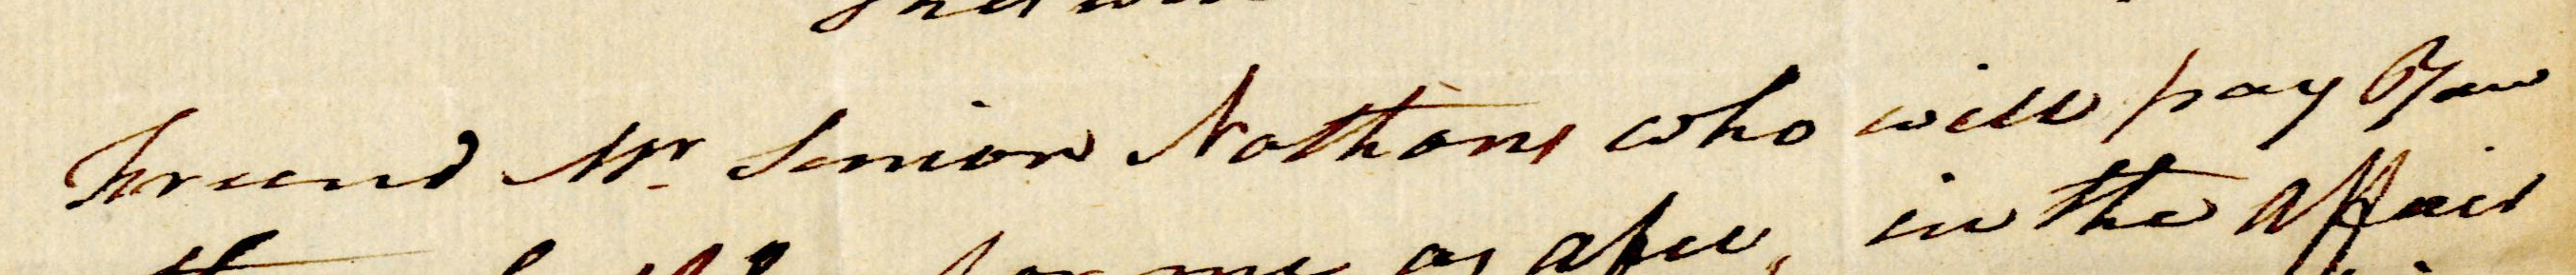Friend M^r. Simon Nathans, who will pay you
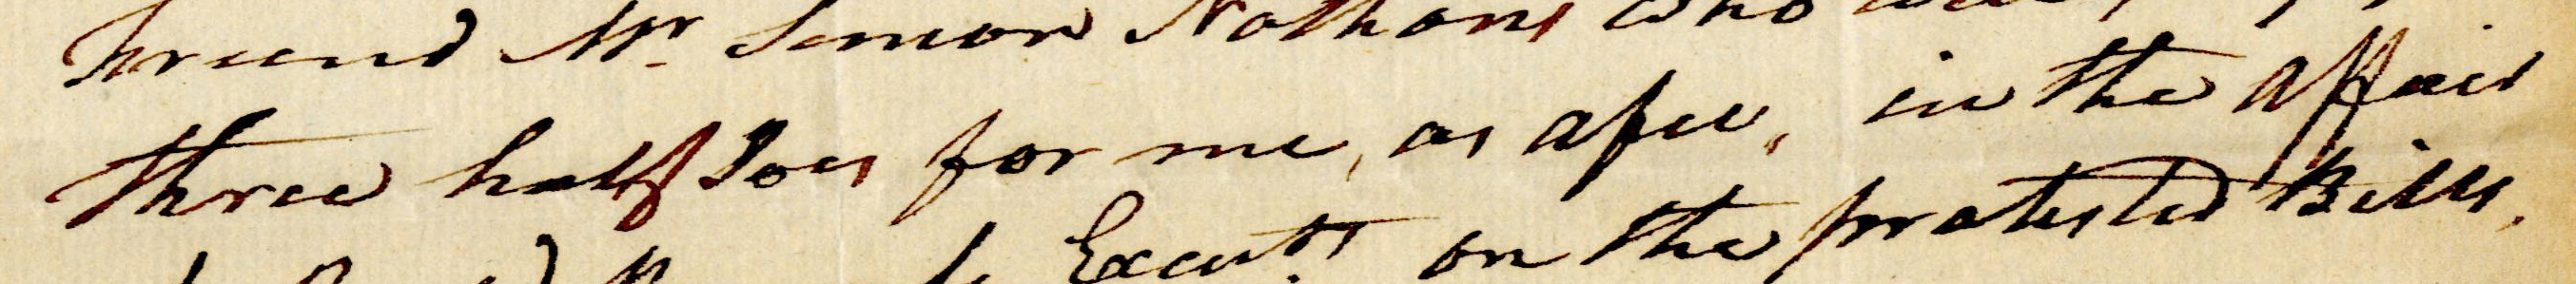three half soes for me, as a fee, in the Affair
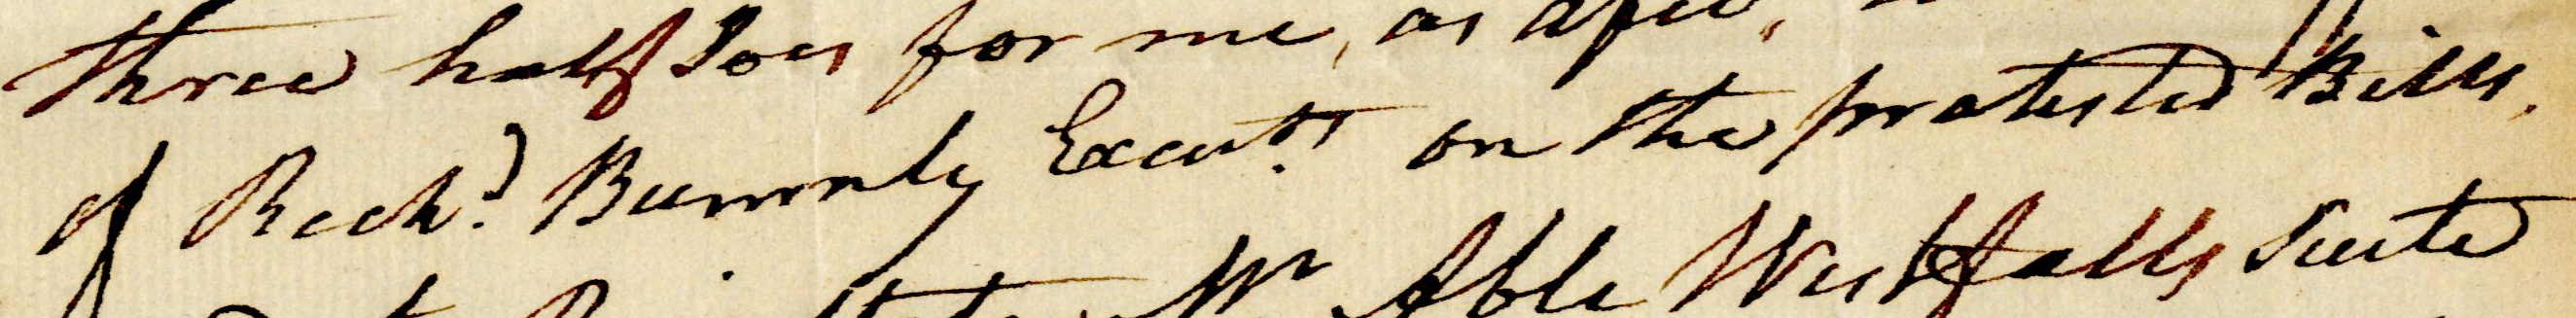of Rich^d. Bunnly Excut^r on the protested Bills
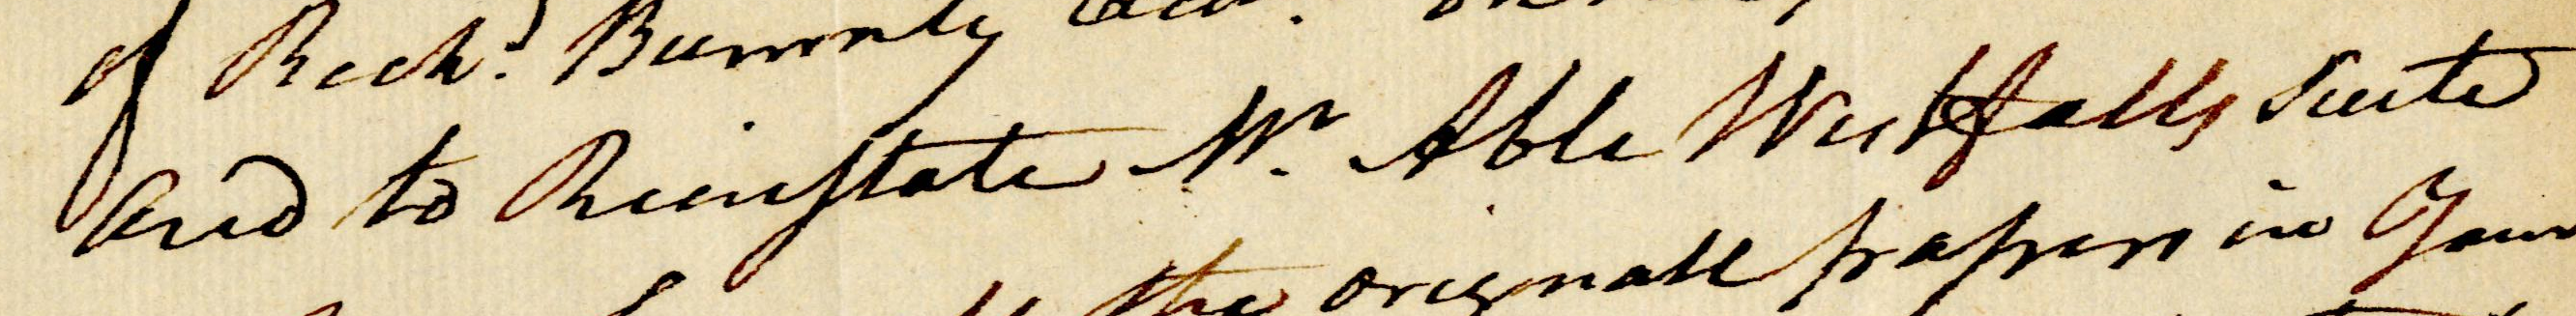and to Reinstate M^r. Able Westfalls suete
